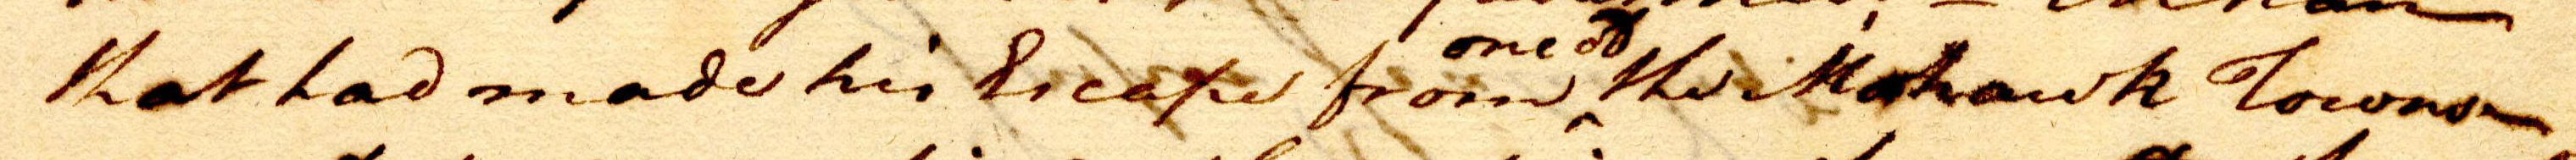that had made his Escape from ^ the Mohawk Towns-
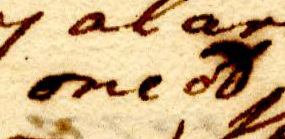one of
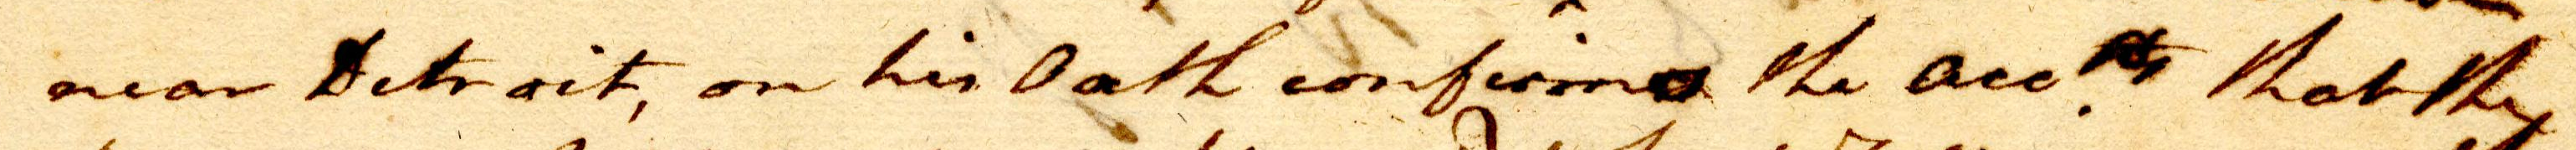near Detroit, on his Oath confirms the acc^ts. that the
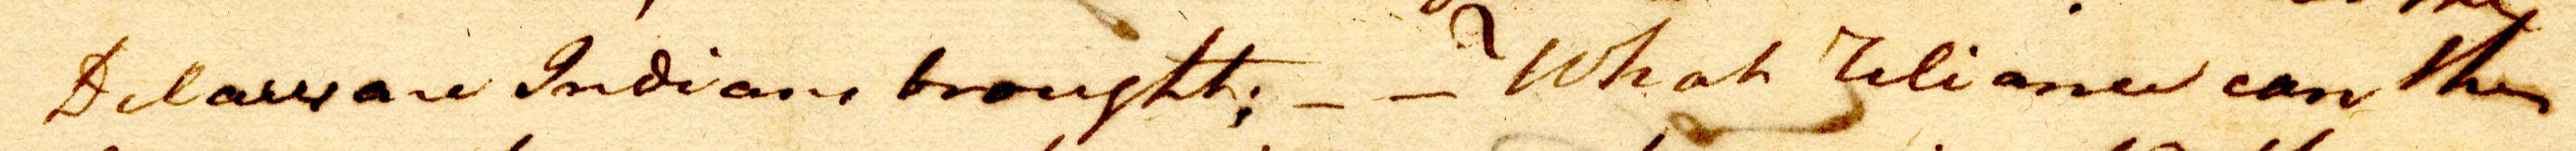Delaware Indians brought;-- What reliance can the
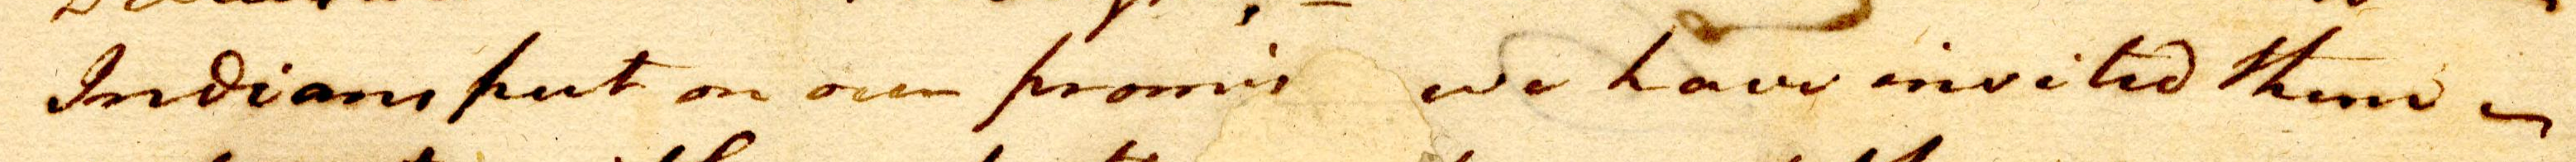Indians put on our promise we have invited them-
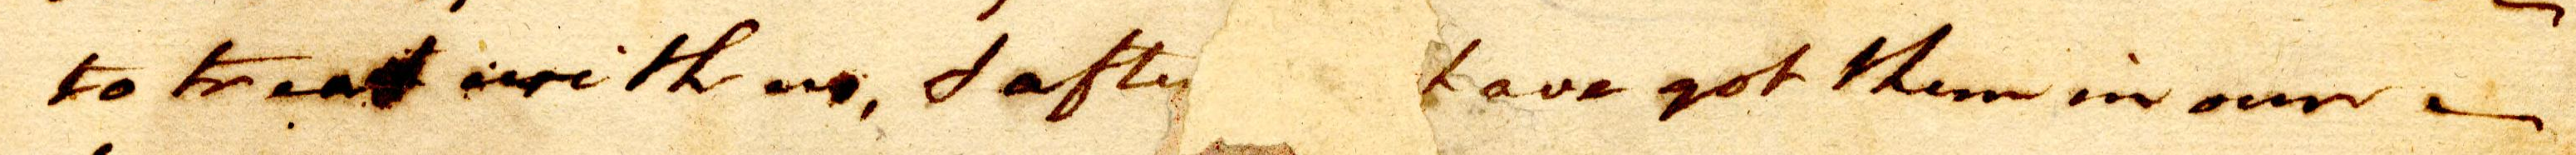to treat with us, & after have got them in our-
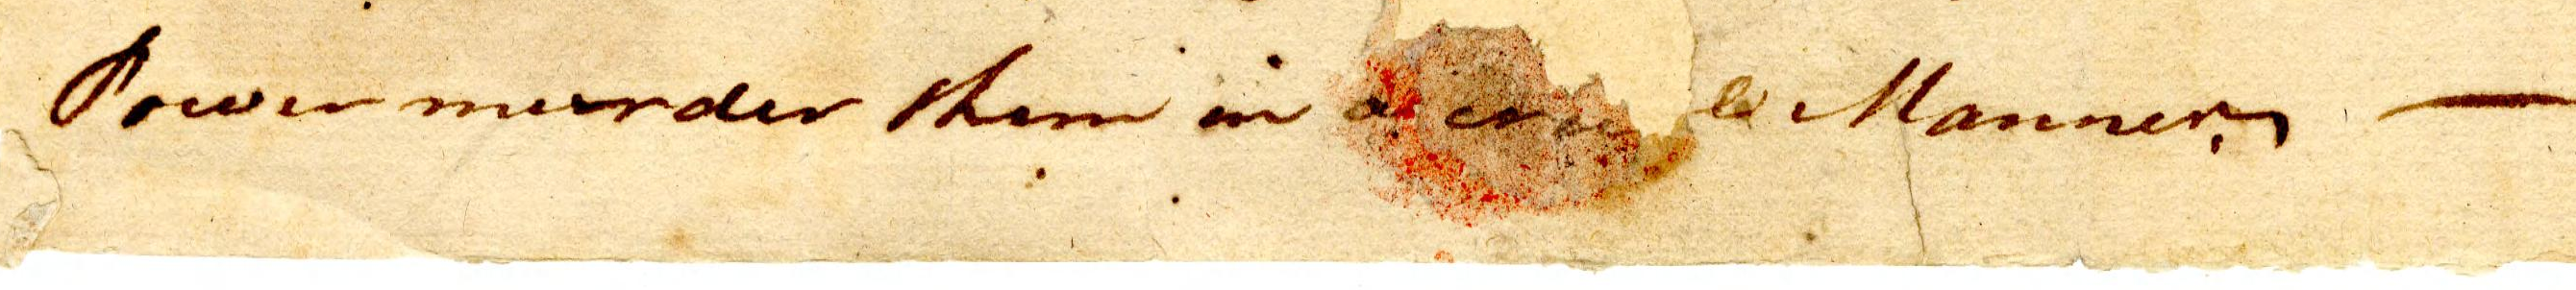Power murder them in a credible Manner.-
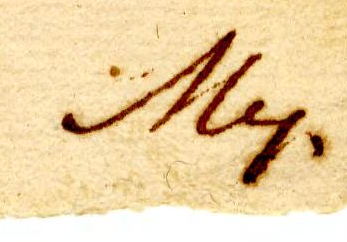My,
